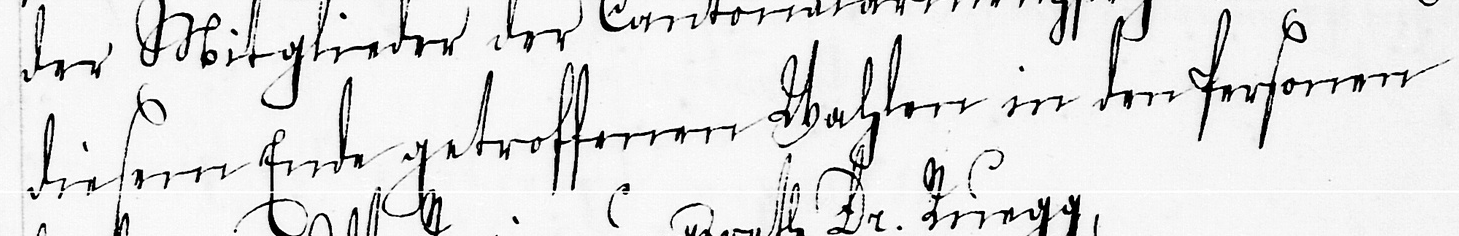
diesem Ende getroffenen Wahlen in den Personen
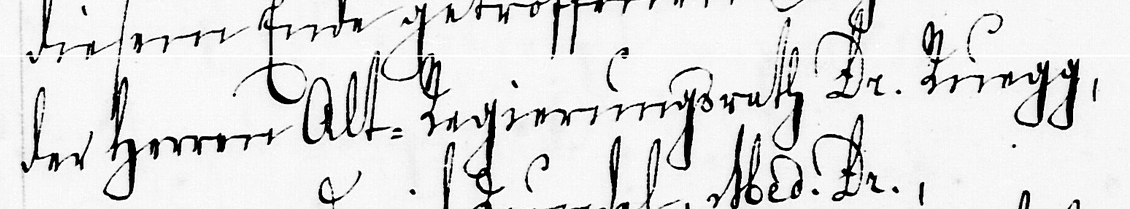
der Herren Alt-Regierungsrath Dr. Rüegg,
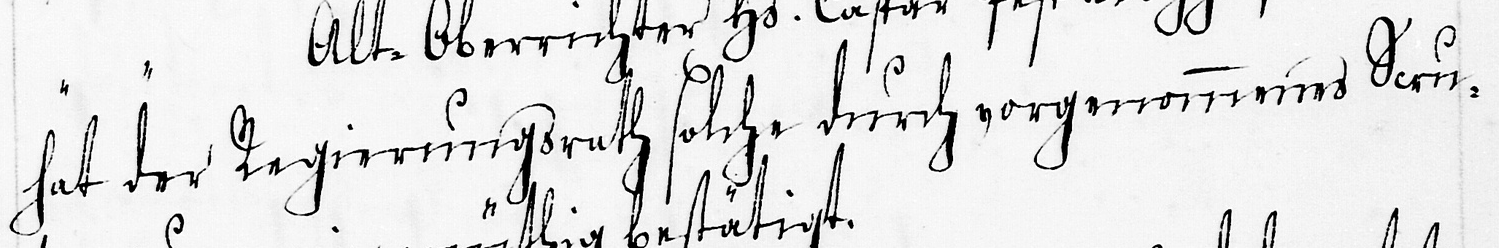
hat der Regierungsrath solche durch vorgenommenes Scru¬
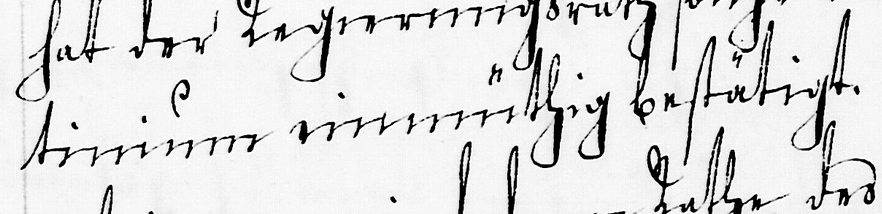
tinium einmüthig bestätigt.
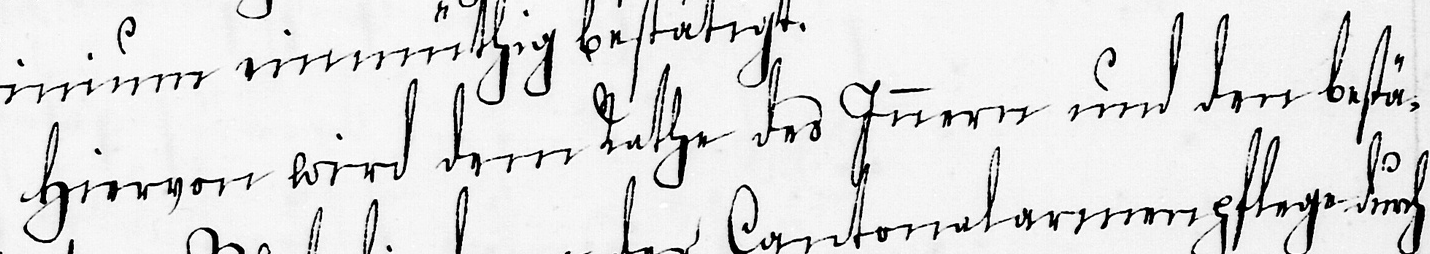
Hiervon wird dem Rathe des Innern und den bestä¬
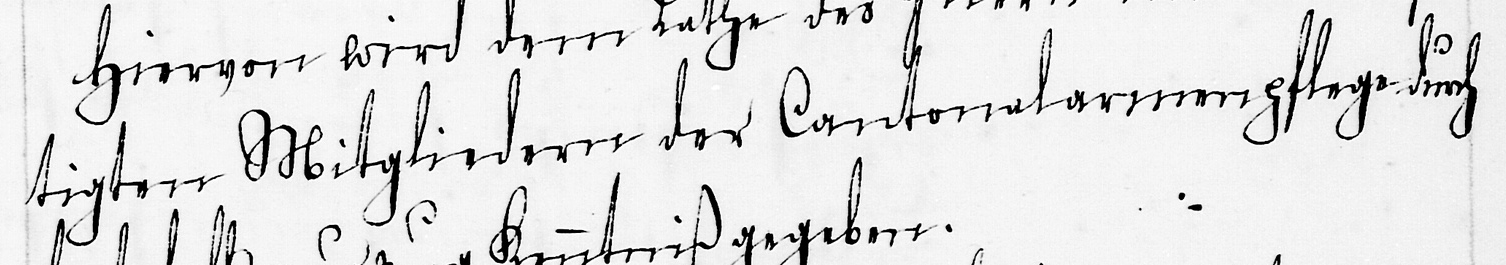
tigten Mitgliedern der Cantonalarmenpflege durch
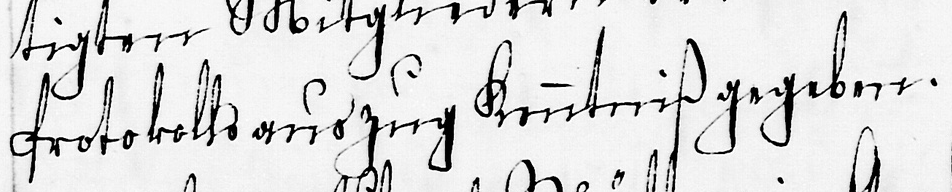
Protokollsauszug Kenntniß gegeben.
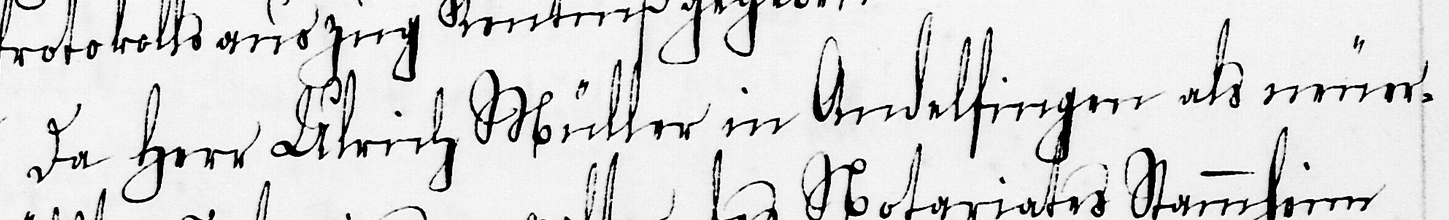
Da Herr Ulrich Müller in Andelfingen als neuer¬
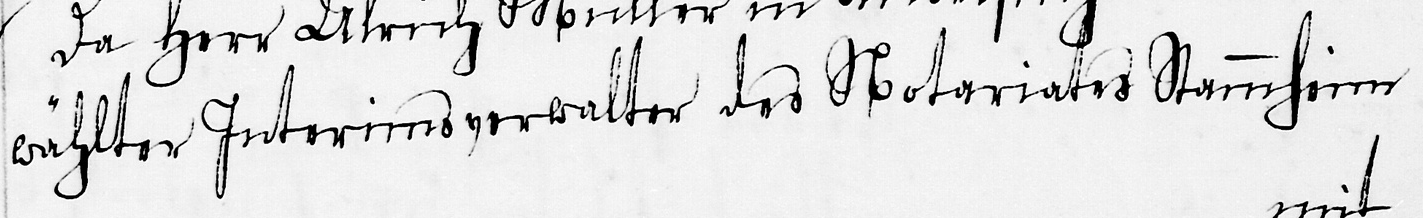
wählter Interimsverwalter des Notariates Stammheim
